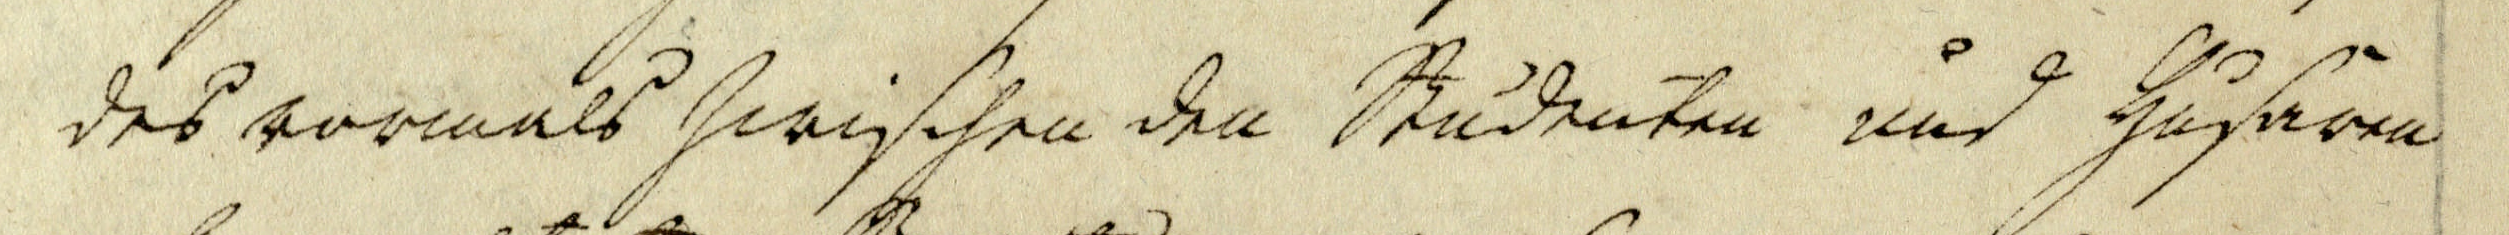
des vormals zwischen den Studenten und Husaren
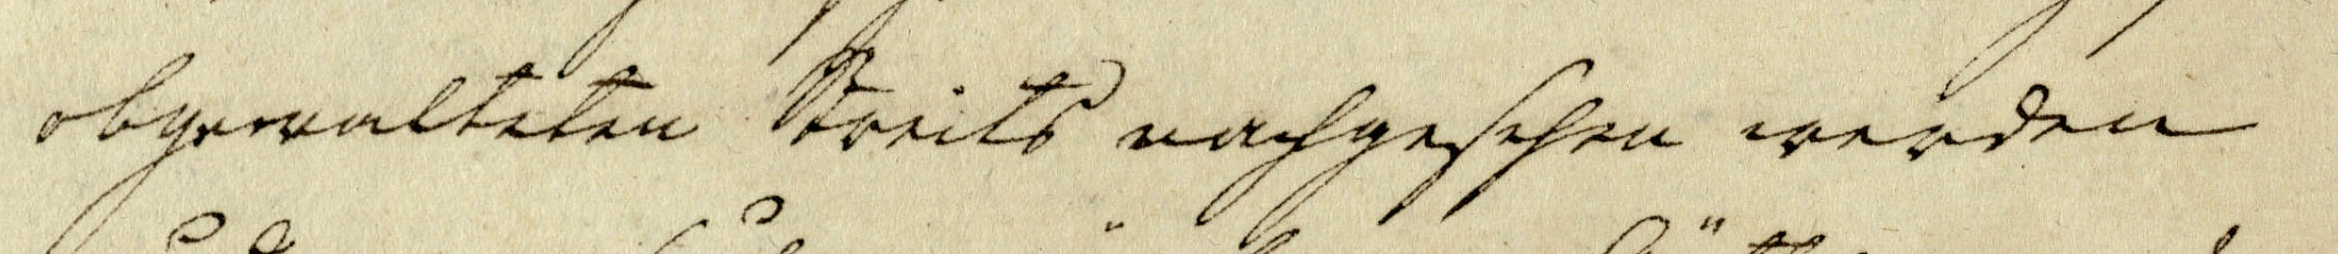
obgewalteten Streits nachgesehen werden
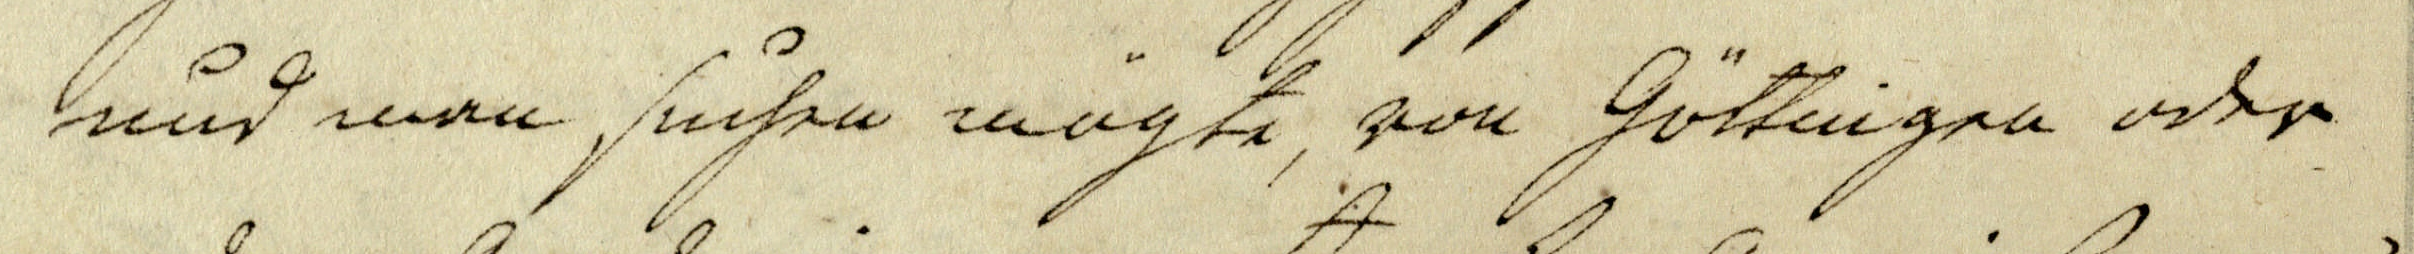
und man suchen mögte, von Göttingen der
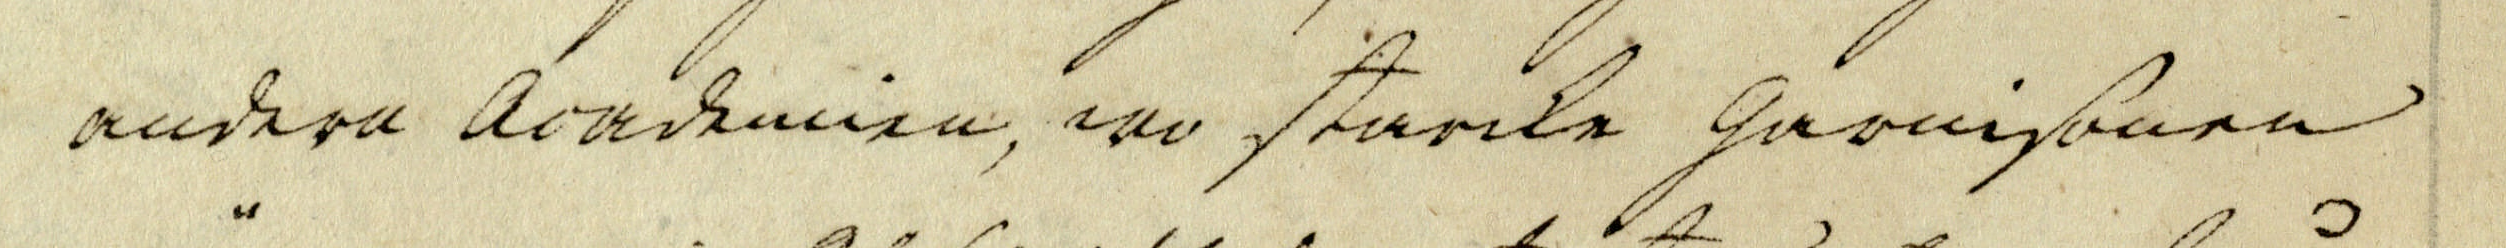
andern Academien, wo starcke Garnisonen
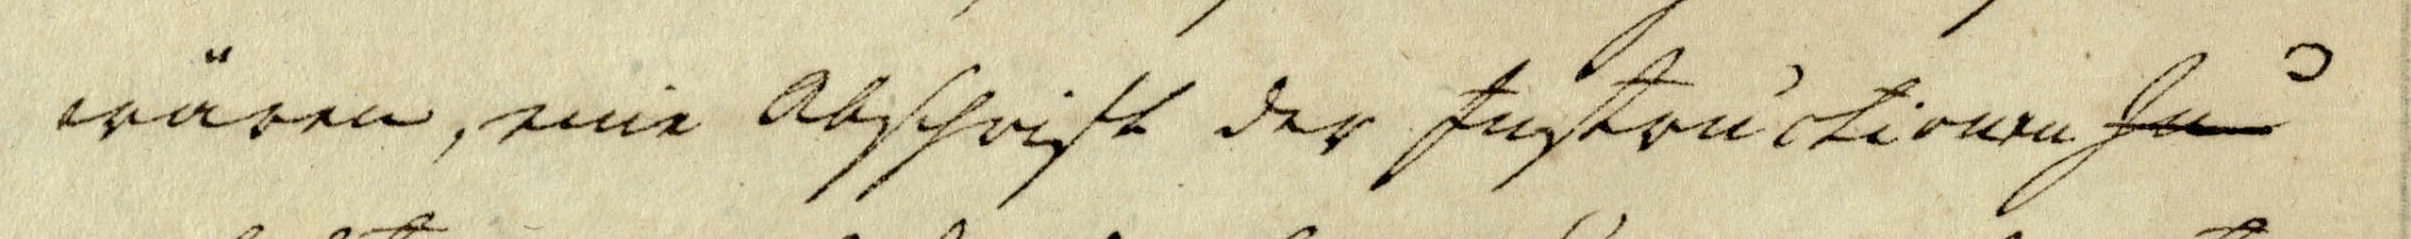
wären, eine Abschrift der Instructionen zu
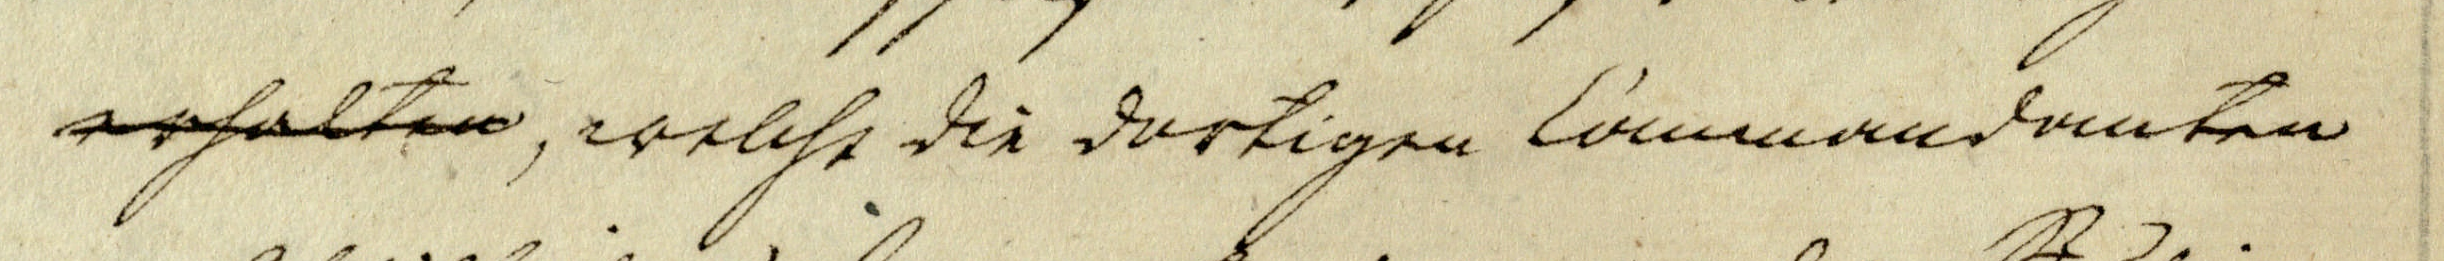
erhalten, welche die dortigen Commandanten
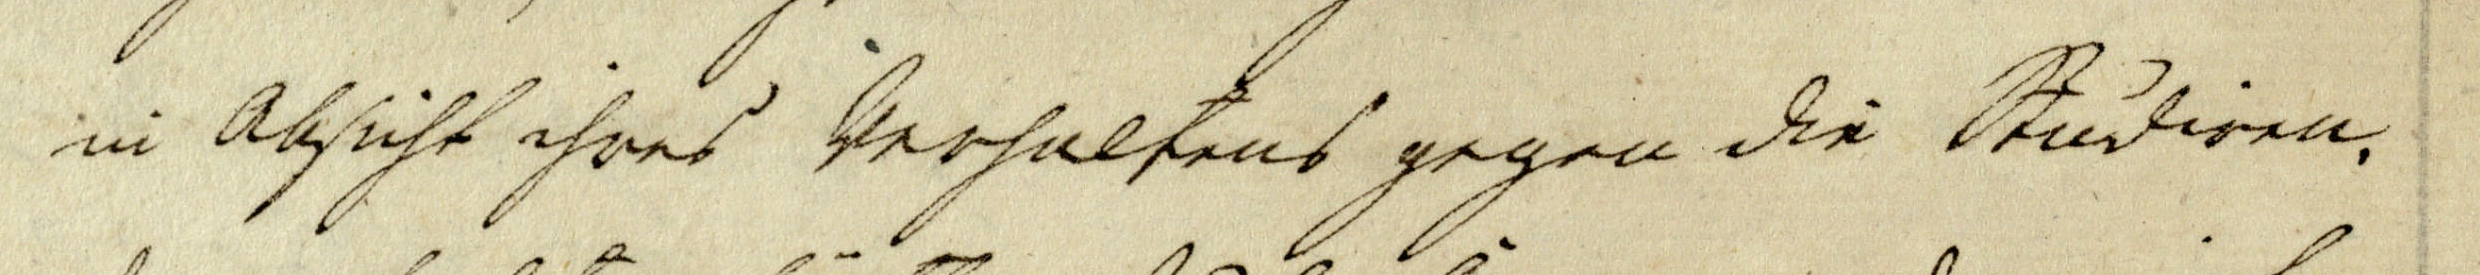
in Absicht ihres Verhaltens gegen die Studiren¬
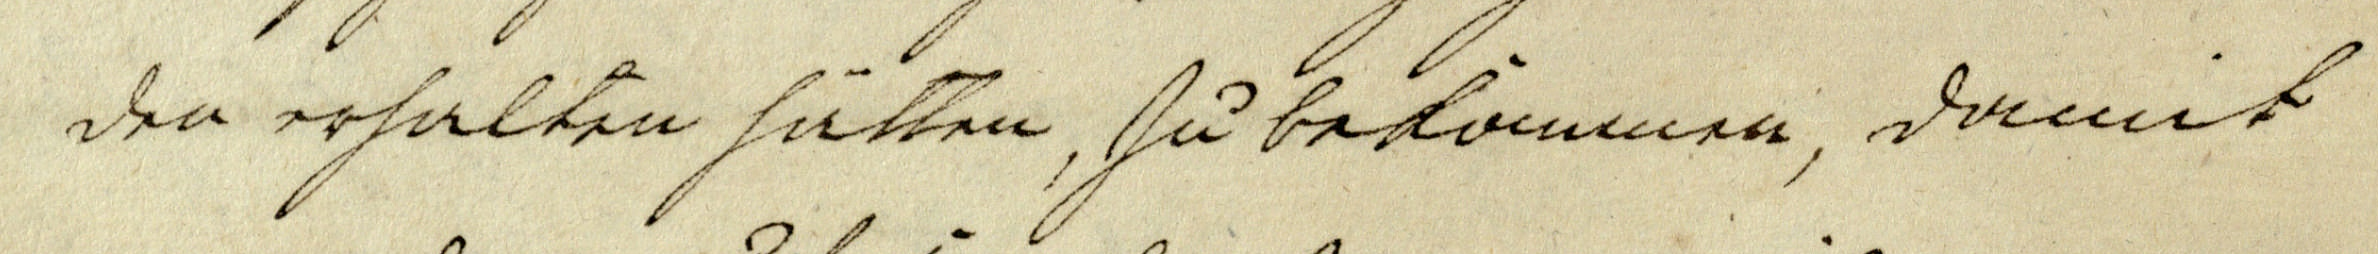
den erhalten hätten, zu bekommen, damit
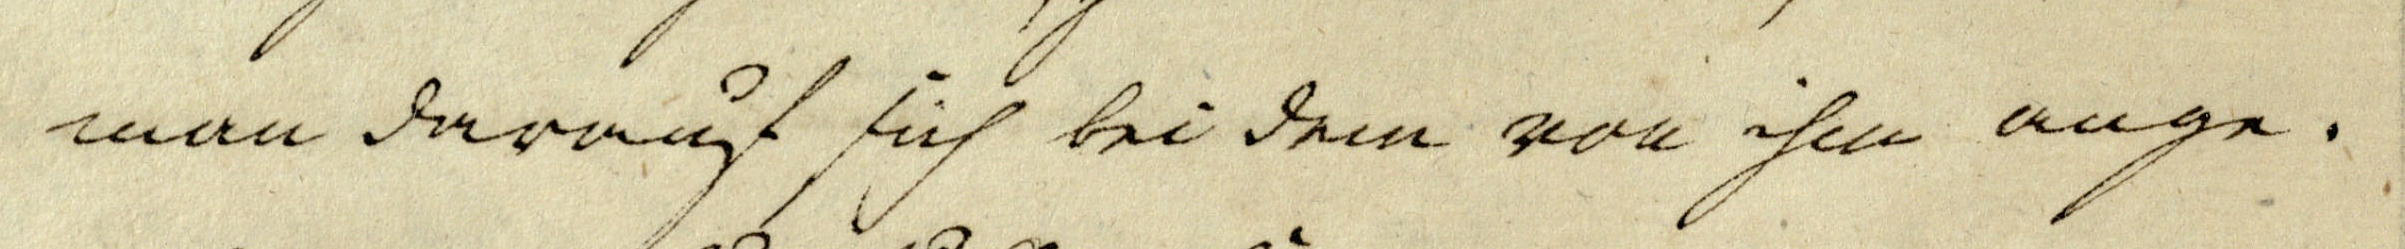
man darauf sich bei dem von ihm ange¬
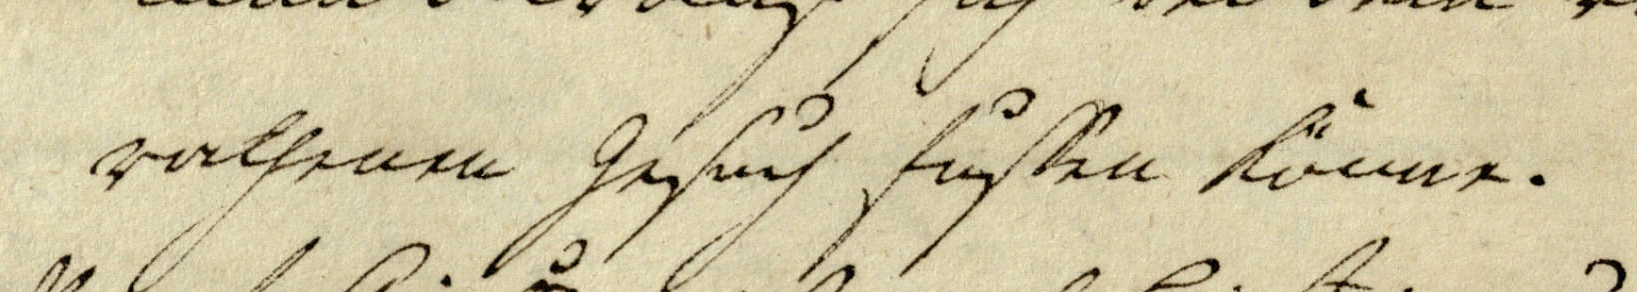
rathenen Gesuch fussen könne.
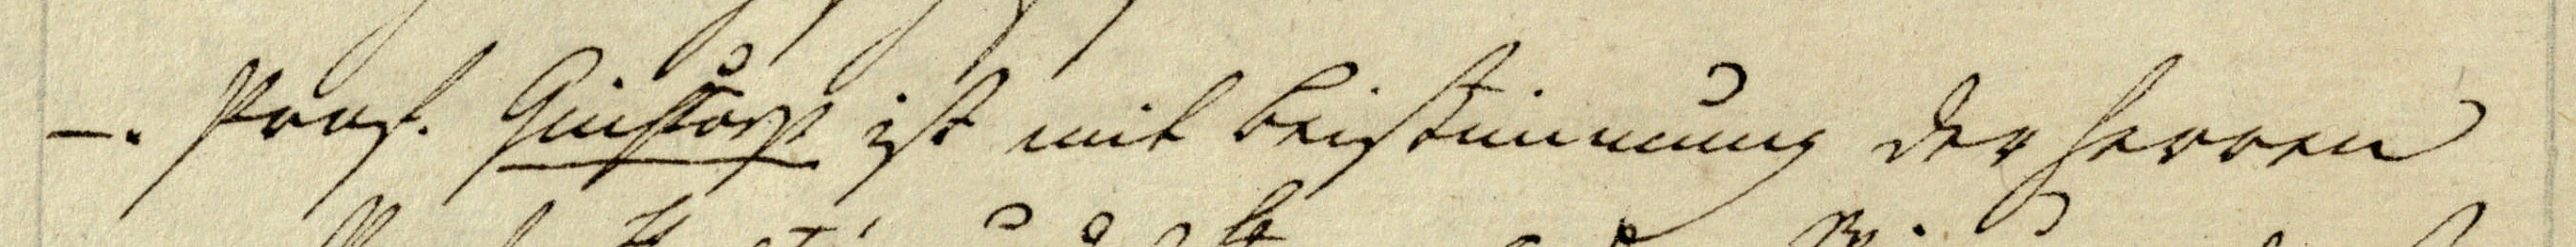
Prof. Quistorp ist mit Beistimmung der Herren
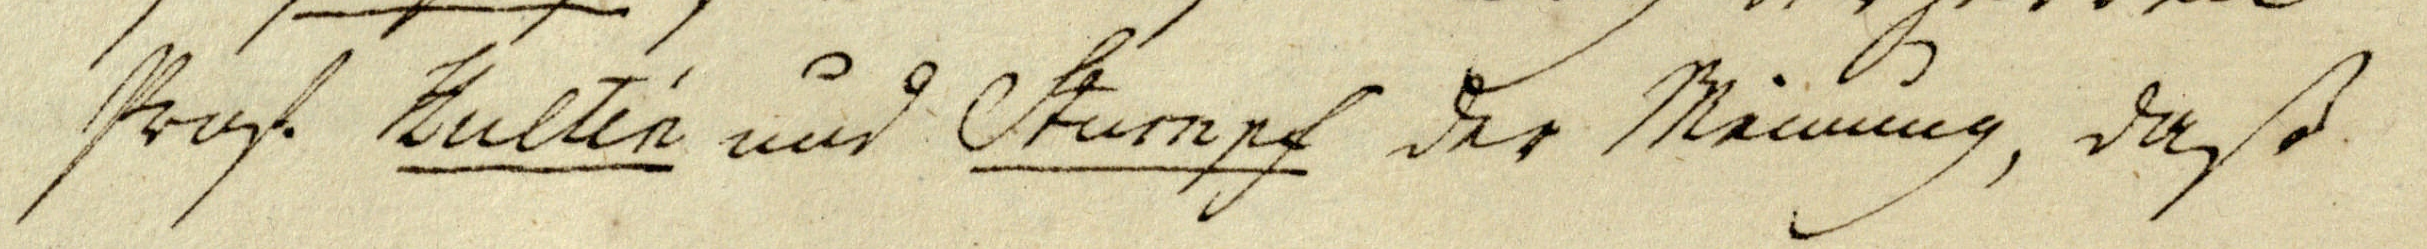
Prof. Hultén und Stumpf der Meinung, daß
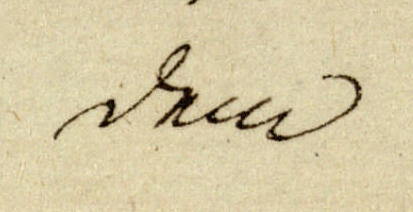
dem
